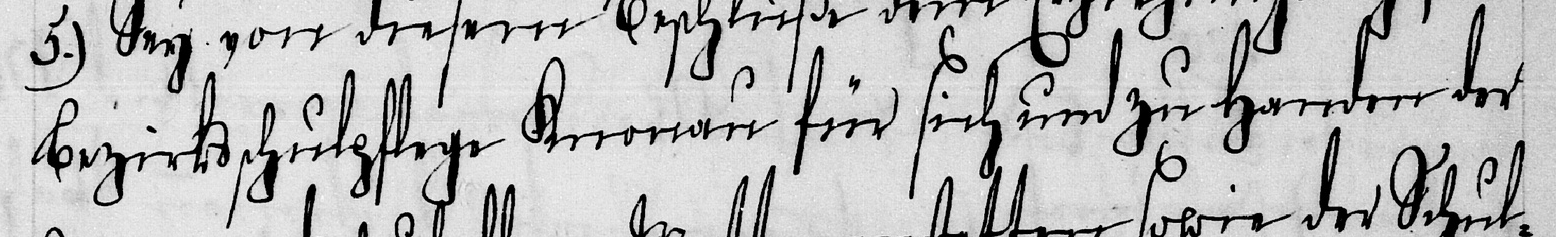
Bezirksschulpflege Knonau für sich und zu Handen der
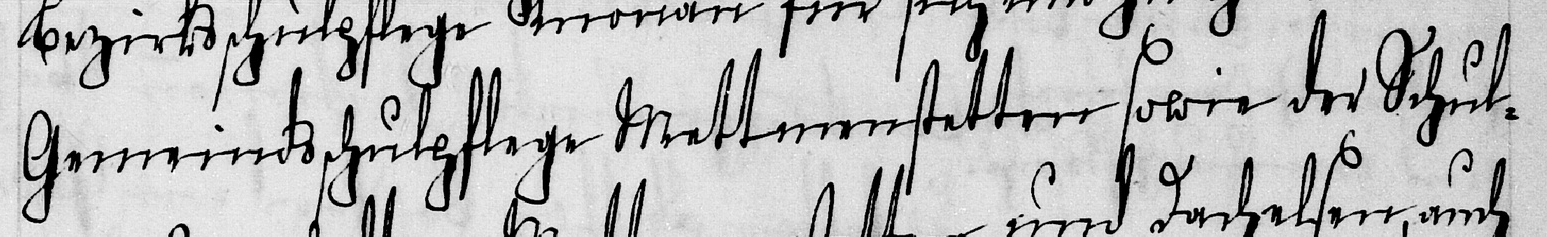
Gemeindsschulpflege Mettmenstetten sowie der Schul¬
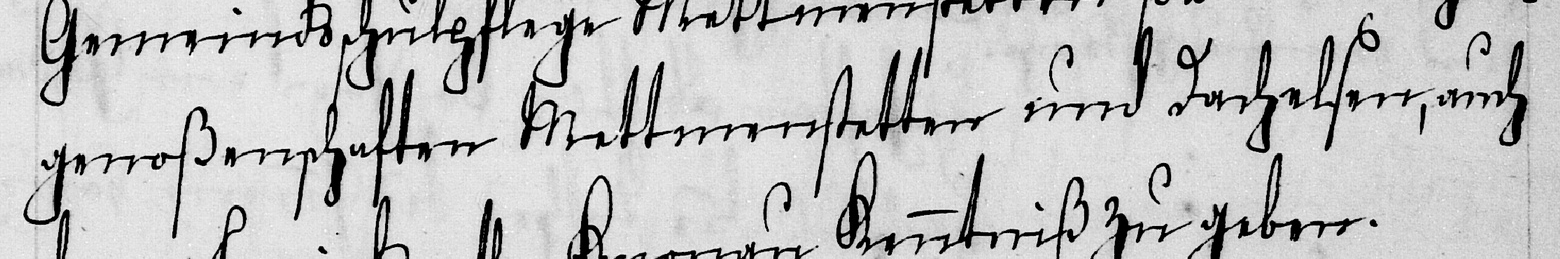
genoßenschaften Mettmenstetten und Dachelsen, auch
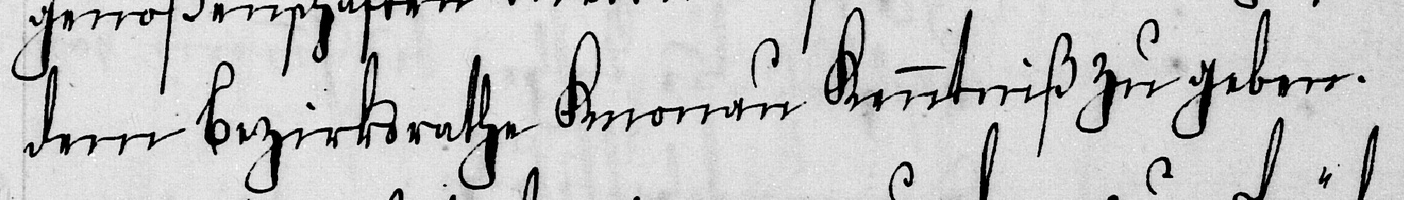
dem Bezirksrathe Knonau Kenntniß zu geben.
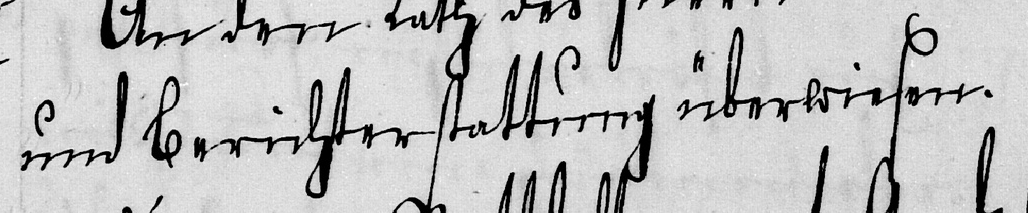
und Berichterstattung überwiesen.
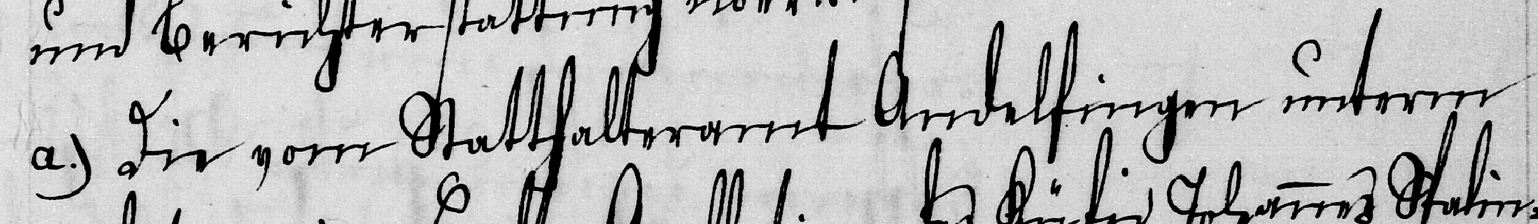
a.) Die vom Statthalteramt Andelfingen unterm
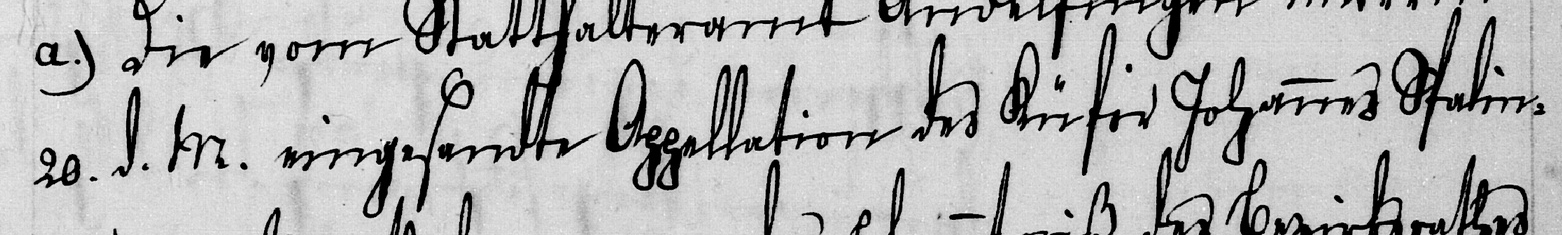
20. d. M. eingesandte Appellation des Küfer Johannes Stalin¬
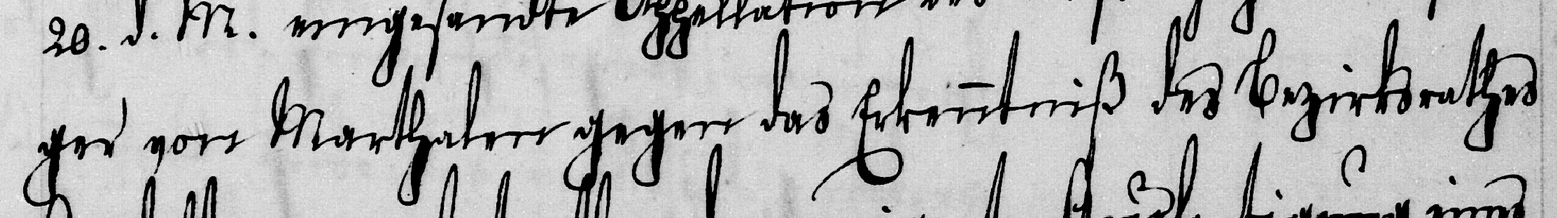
ger von Marthalen gegen das Erkenntniß des Bezirksrathes
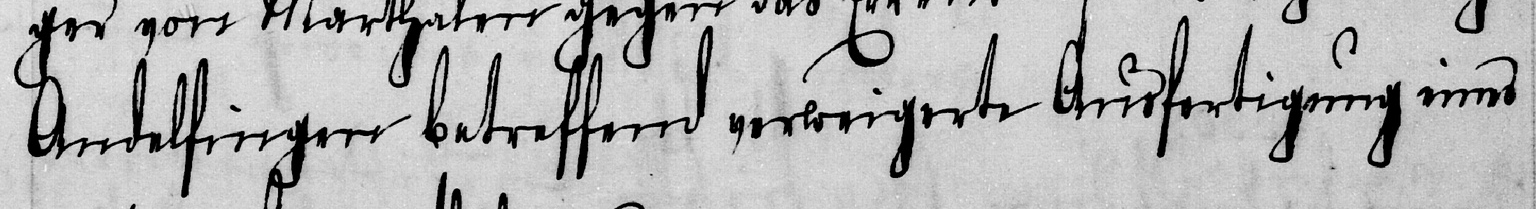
Andelfingen betreffend verweigerte Ausfertigung eines
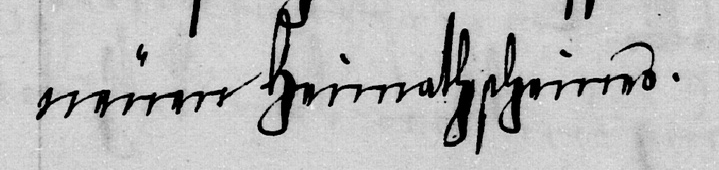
neuen Heimathscheines.
